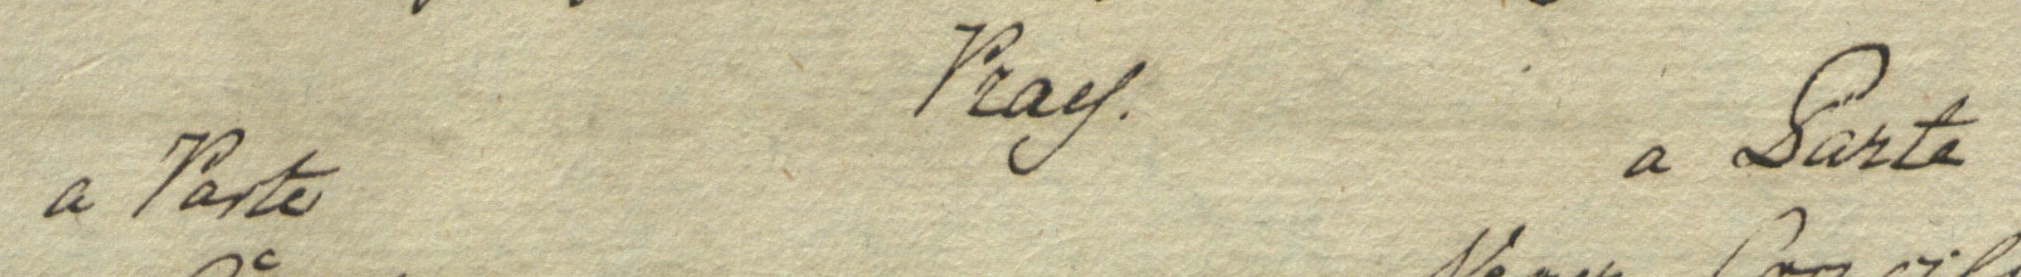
a Parte a Parte
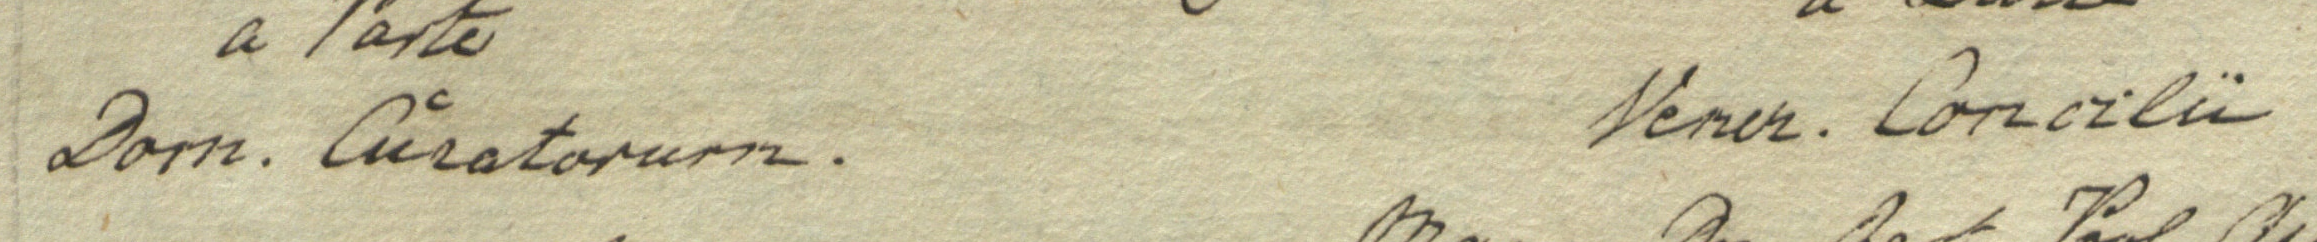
Dom. Curatorum. Vener. Concilii
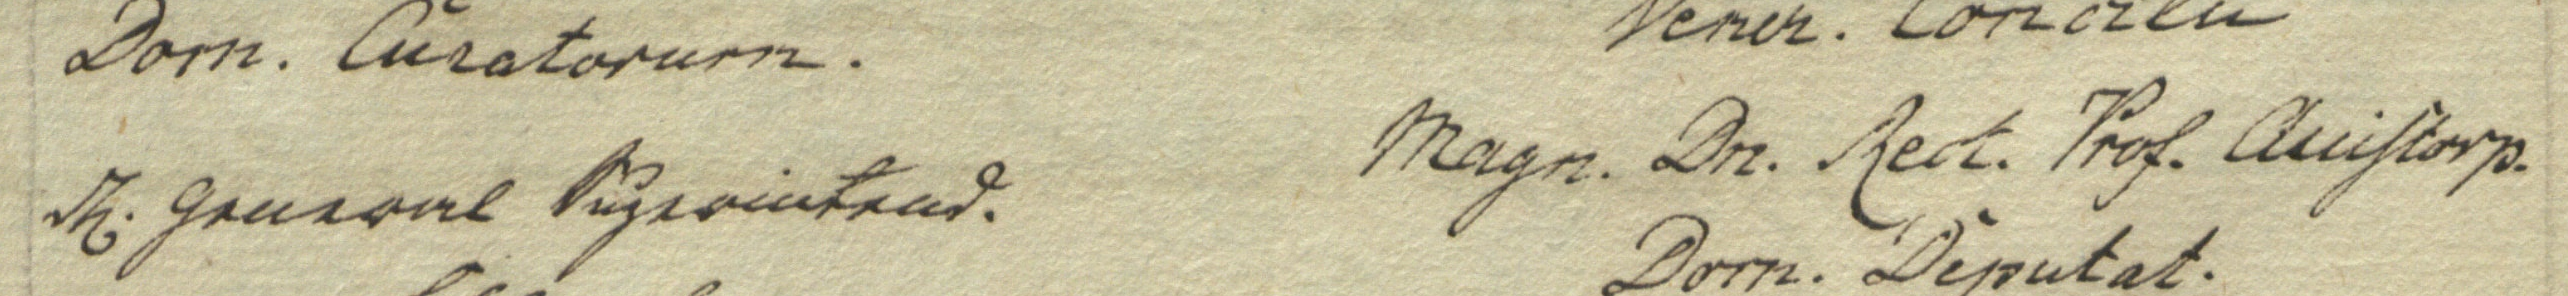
dh. General Superintend. Magn. Dn. Rect. Prof. Quistorp.
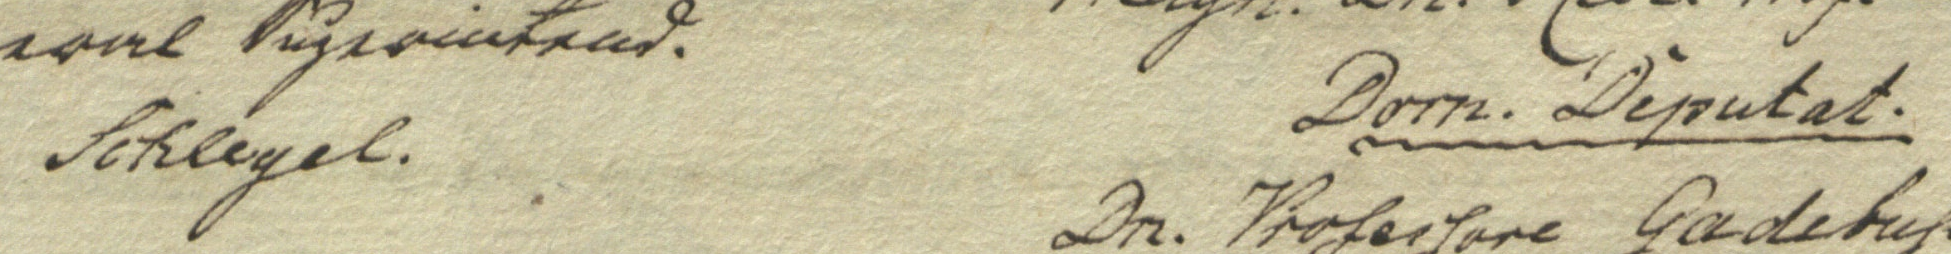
Schlegel. Dom. Deputat.
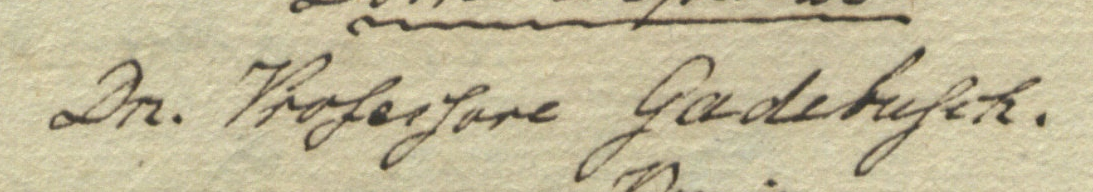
Dn. Professore Gadebusch.
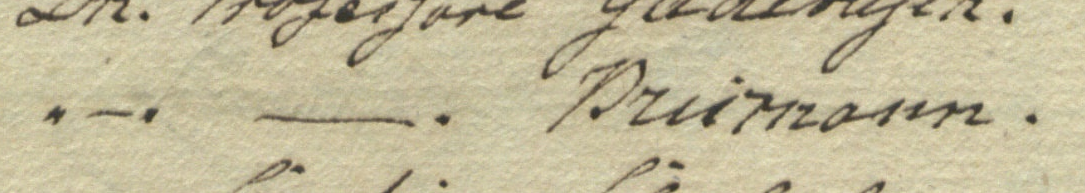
Brismann.
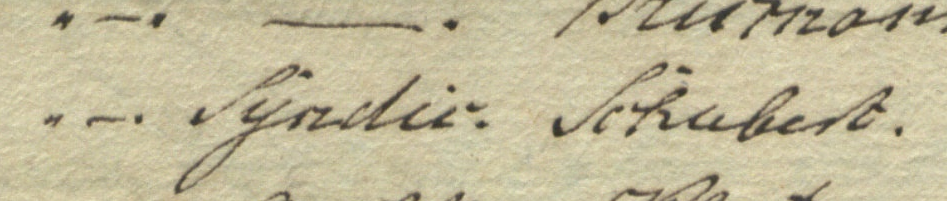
Sÿndic: Schubert.
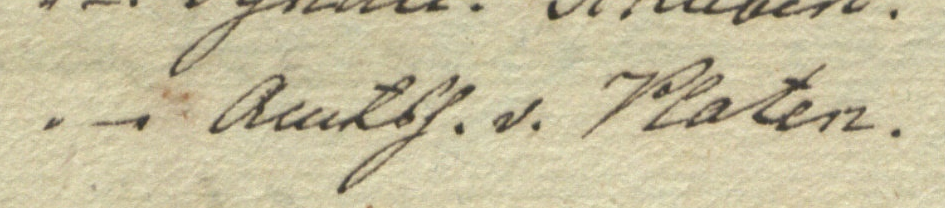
Amtsh. v. Platen.
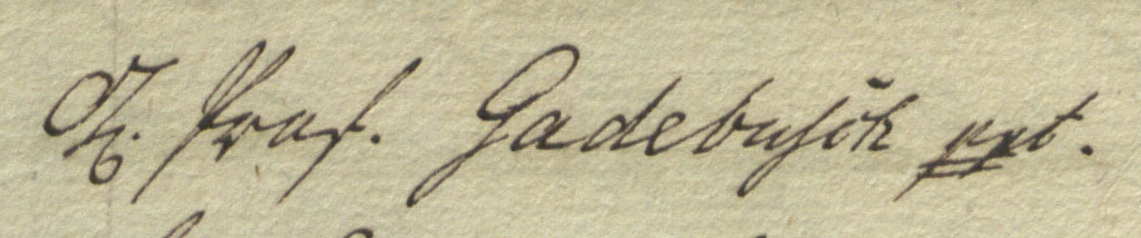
dh. Prof. Gadebusch ppt.
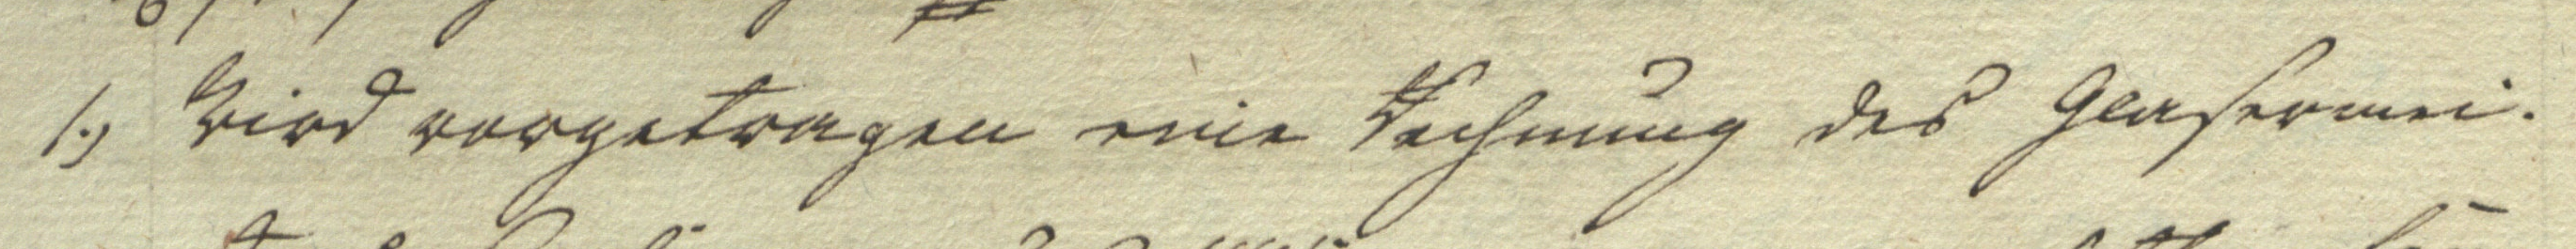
1., Wird vorgetragen eine Rechnung des Glasermei¬
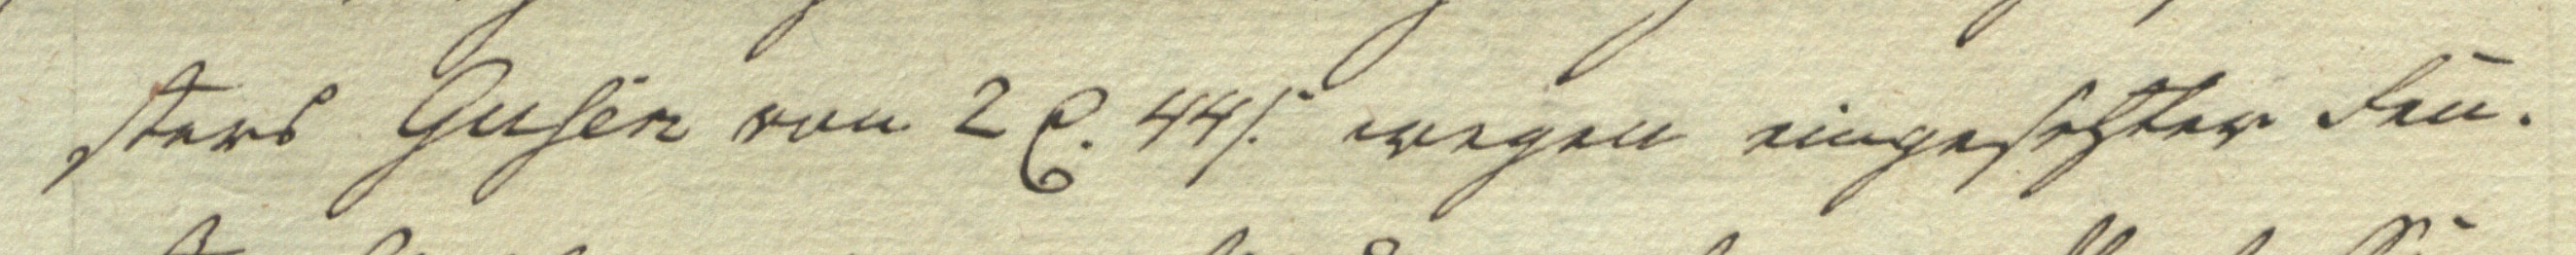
sters Gusen von 2 l. 44 s. wegen eingesetzter Fen¬
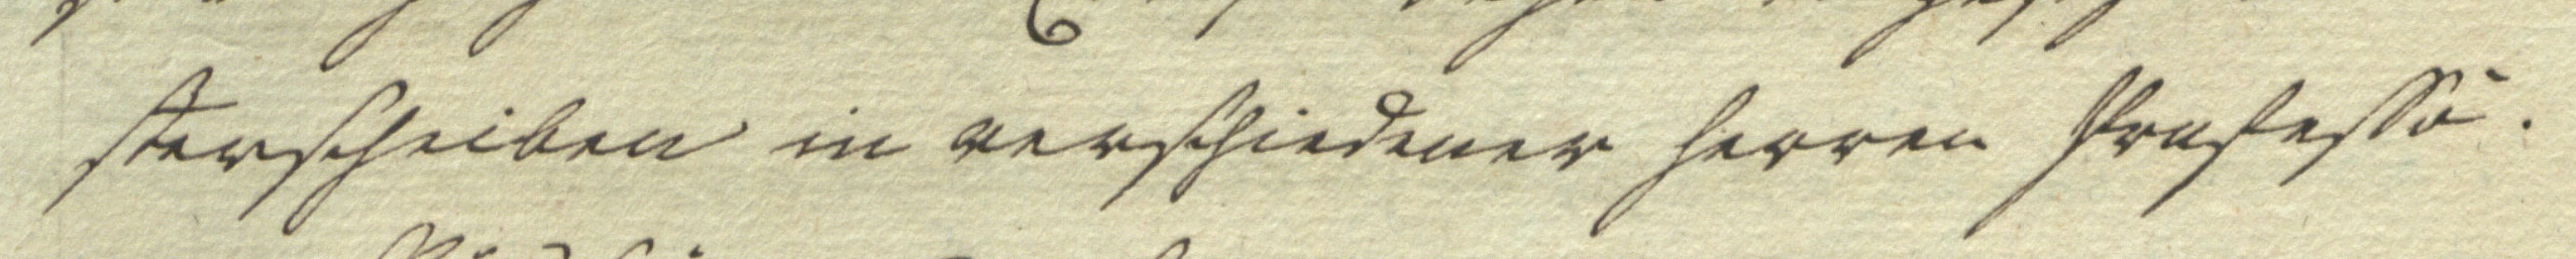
sterscheiben in verschiedener Herren Professo¬
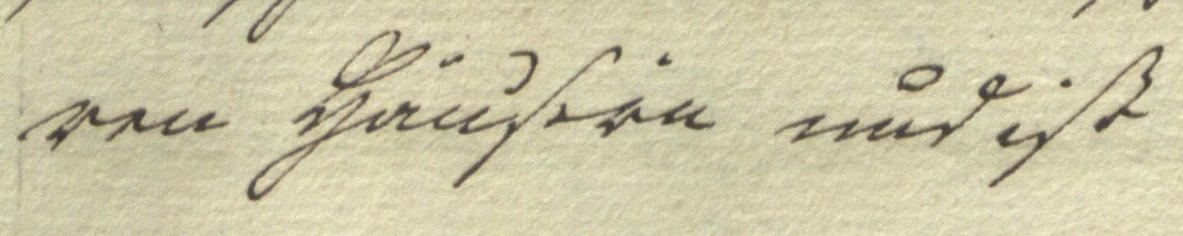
ren Häusern und ist
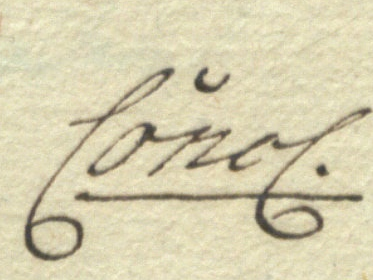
Concl.
